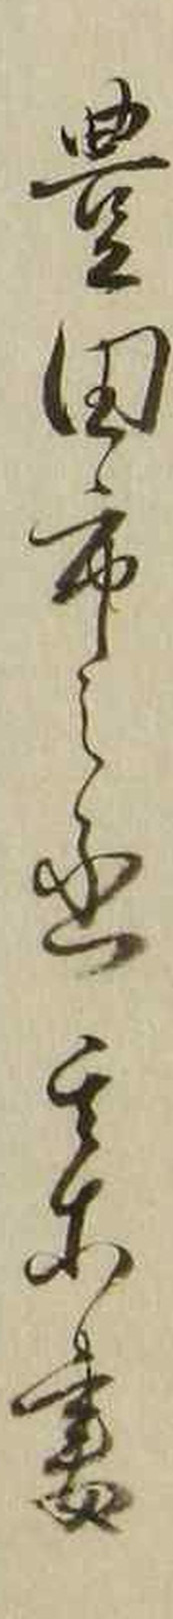女豊田市之丞某妻
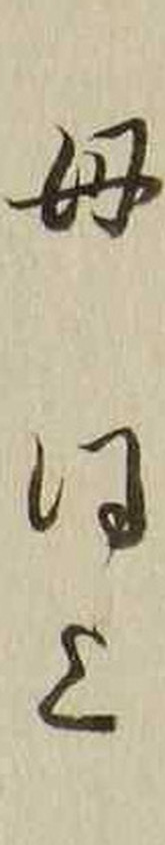母同上
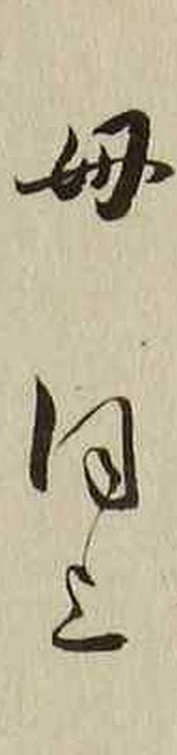母同上
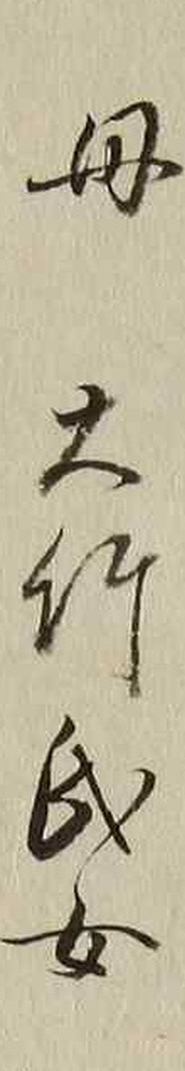母大竹氏女
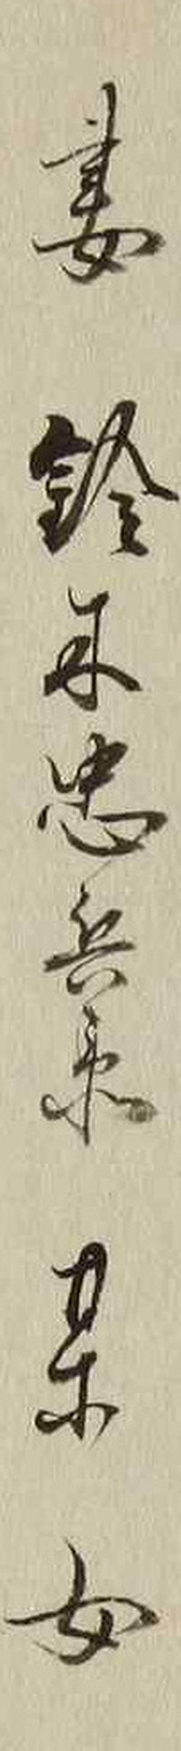妻鈴木忠兵衛某女
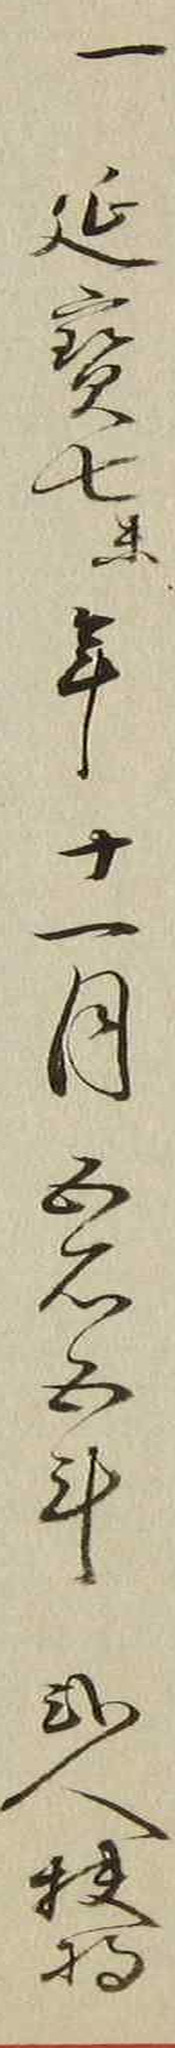一延宝七未年十一月五石五斗弐人扶持
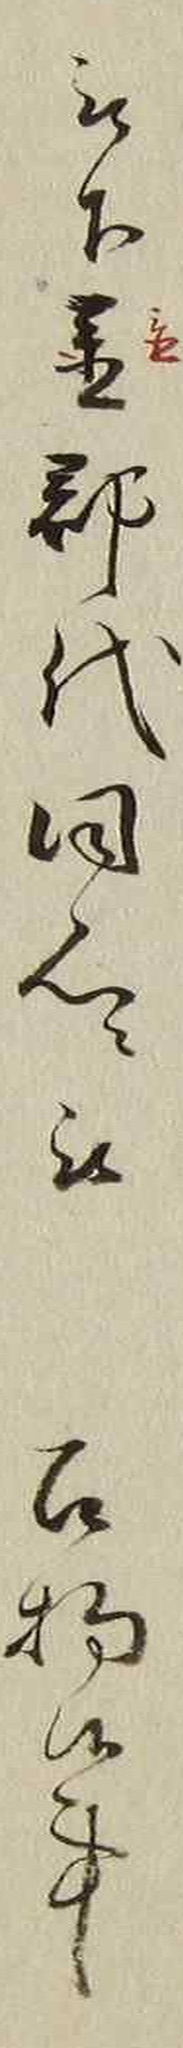被下置郡代同心ニ被召抱候事
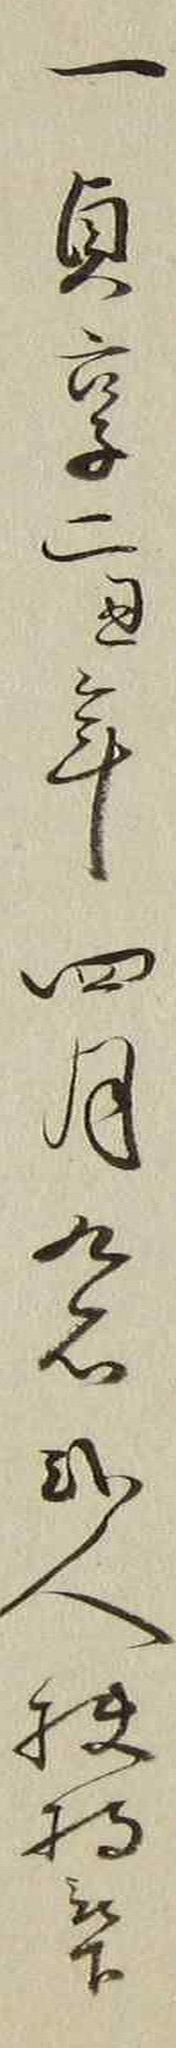一貞享二丑年四月九石弐人扶持被下
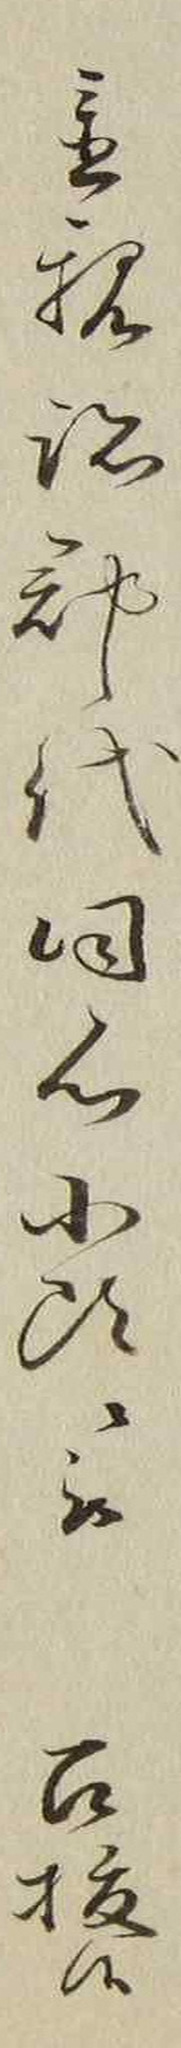置親跡郡代同心小頭ニ被召授候
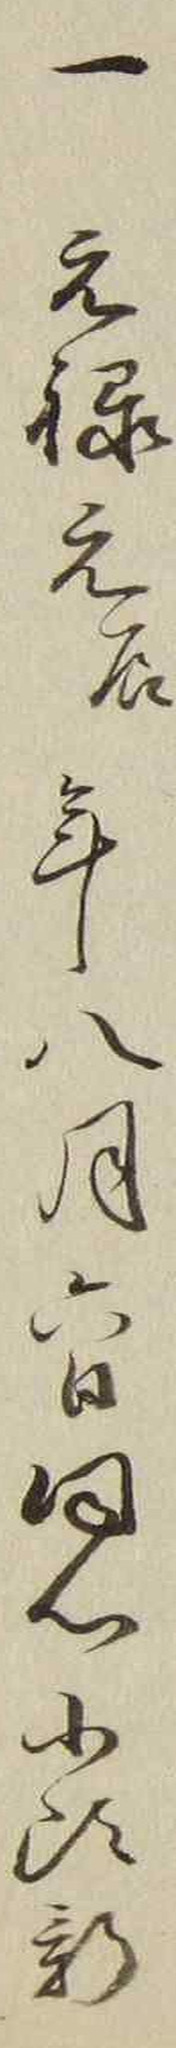一元禄元辰年八月六日同心小頭新

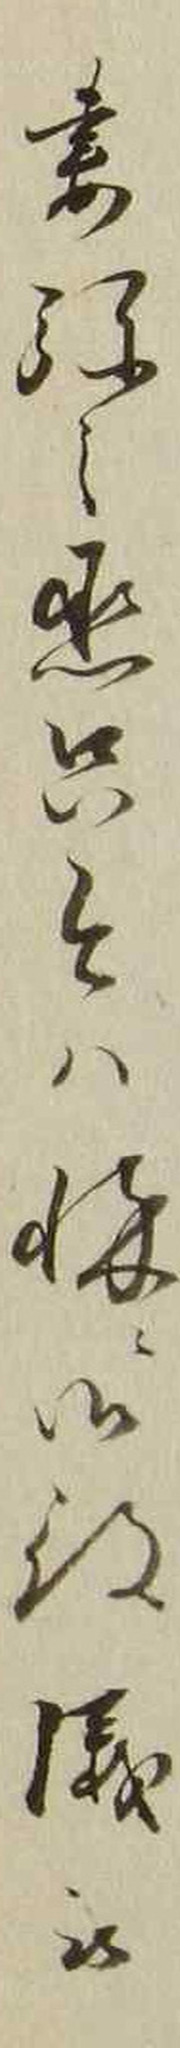妻弥之丞只今ハ忰ニ御役儀被
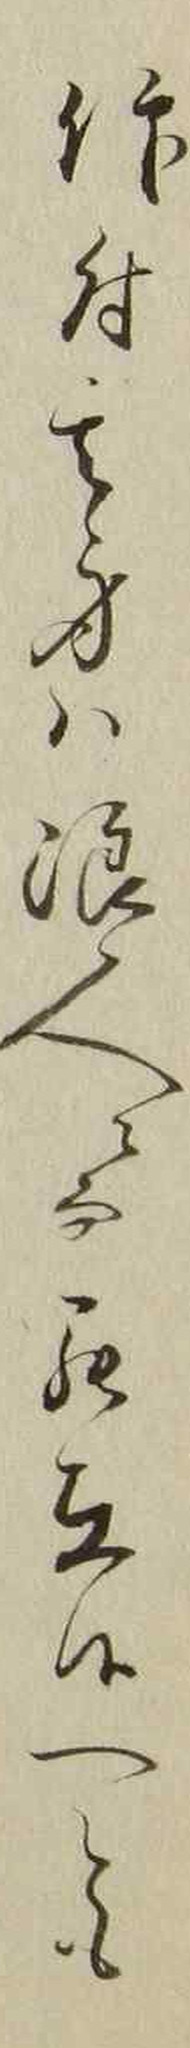仰付其身ハ浪人ニ而罷在候へとも
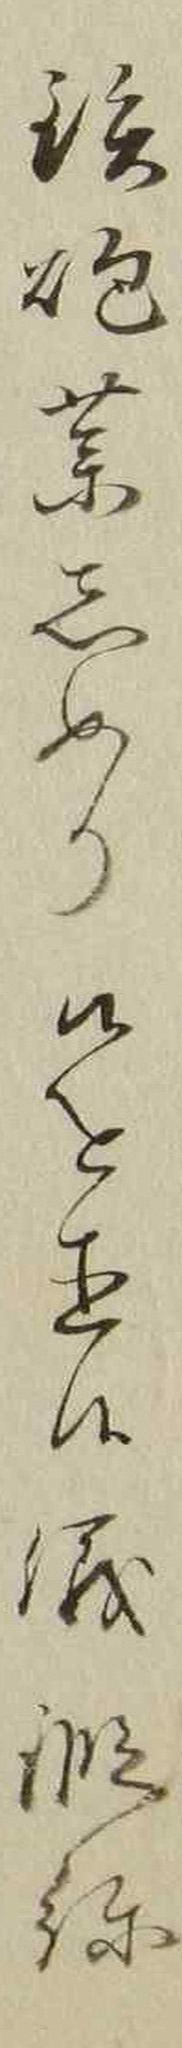鉄炮薬わかり候を直候儀鍛練
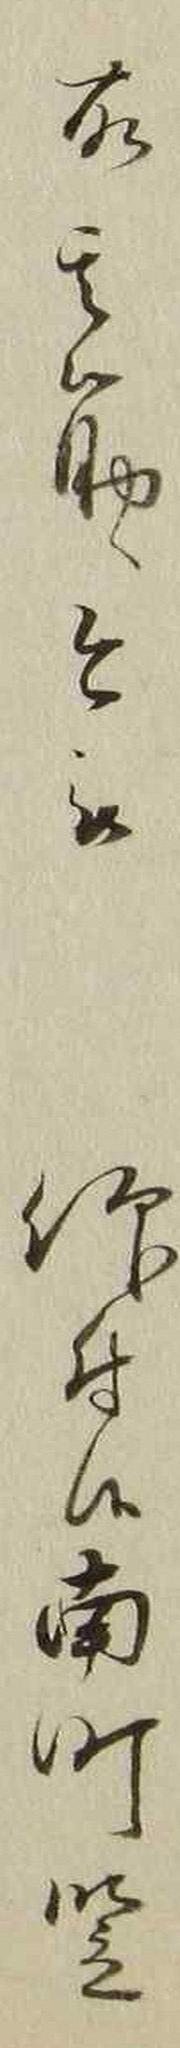故其筋へと被仰付候南町竪
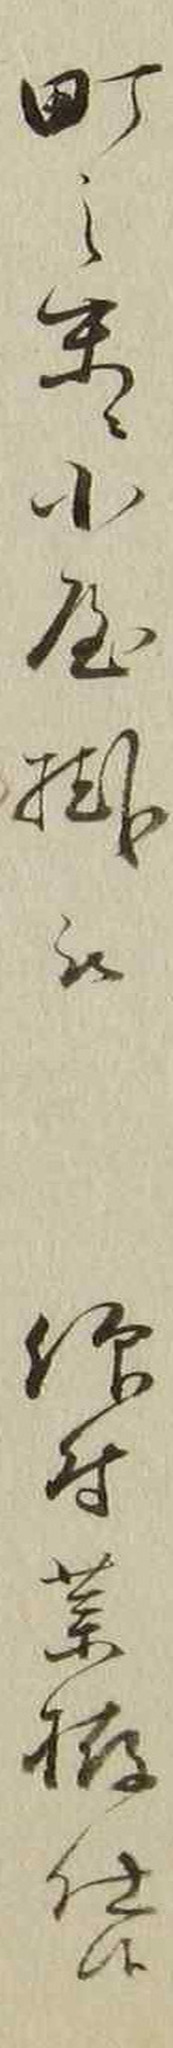町之末ニ小屋掛被仰付薬拵仕候
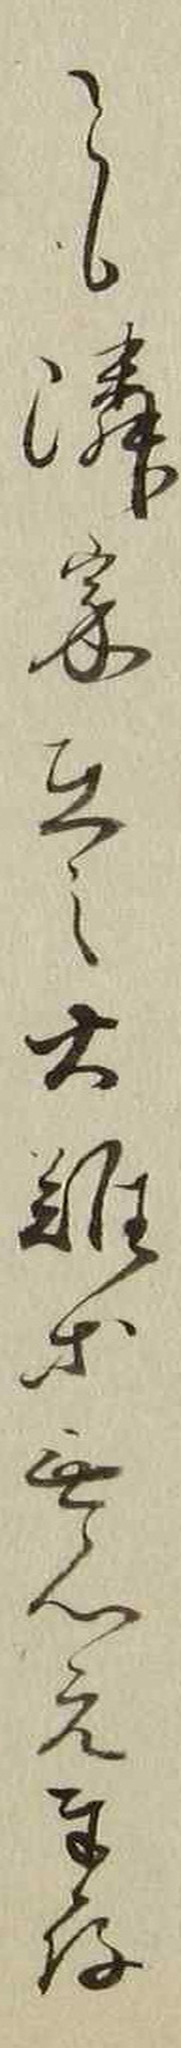へとも隣家在之火難等無心奉存
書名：諸士系譜　巻之52　に之部3
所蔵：会津若松市立会津図書館
